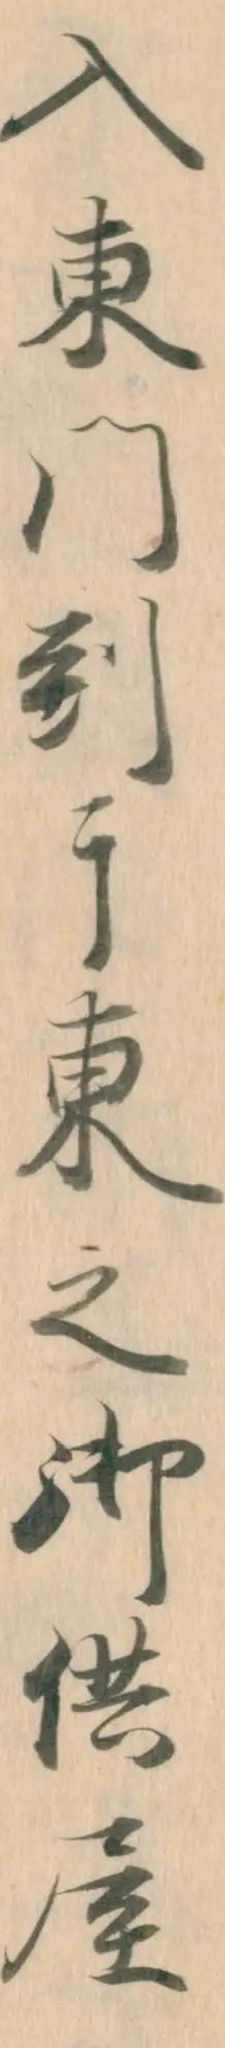入東門到于東之御供屋
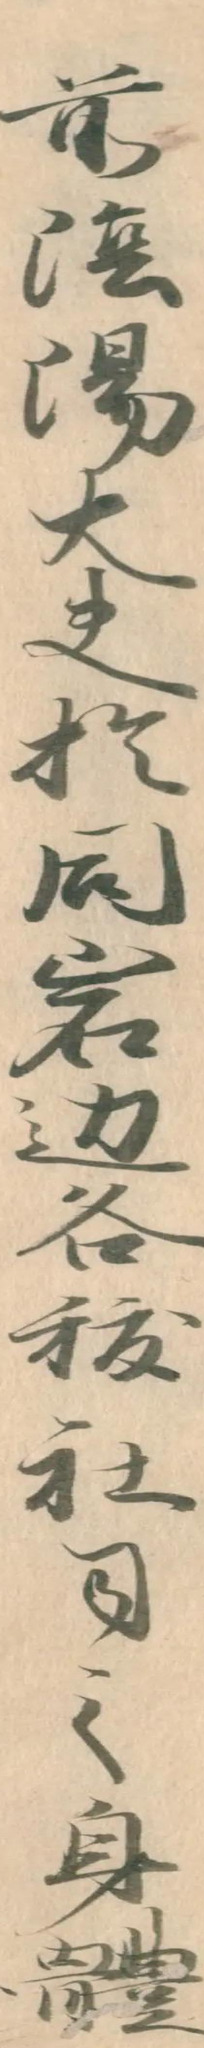前陰陽大夫於同岩辺各祓社司之身體
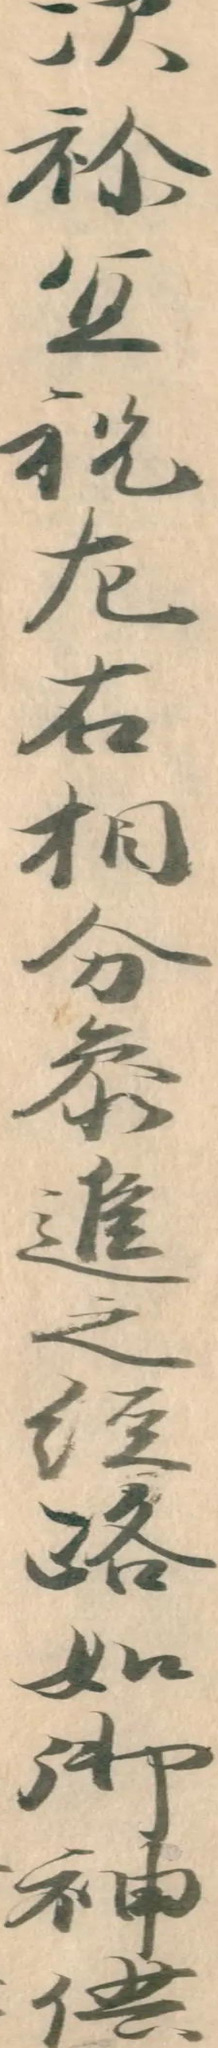次禰宜祝左右相分参進之経路如御神供
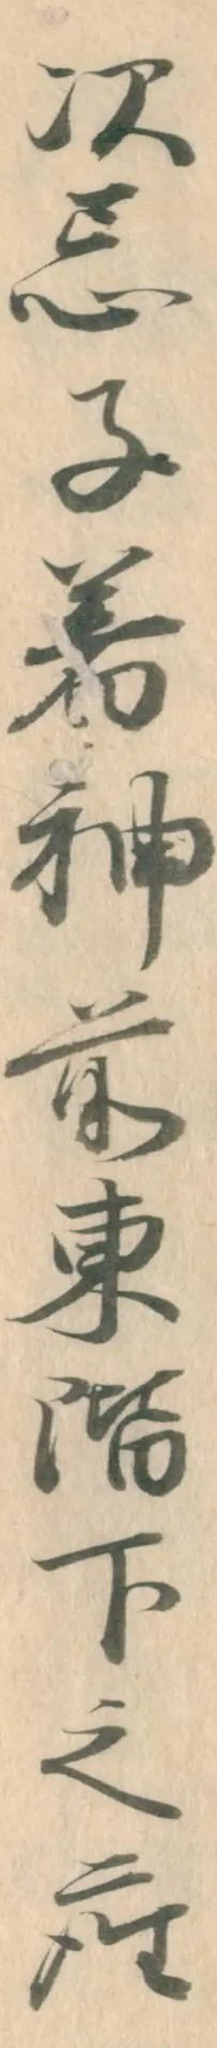次忌子着神前東階下之座
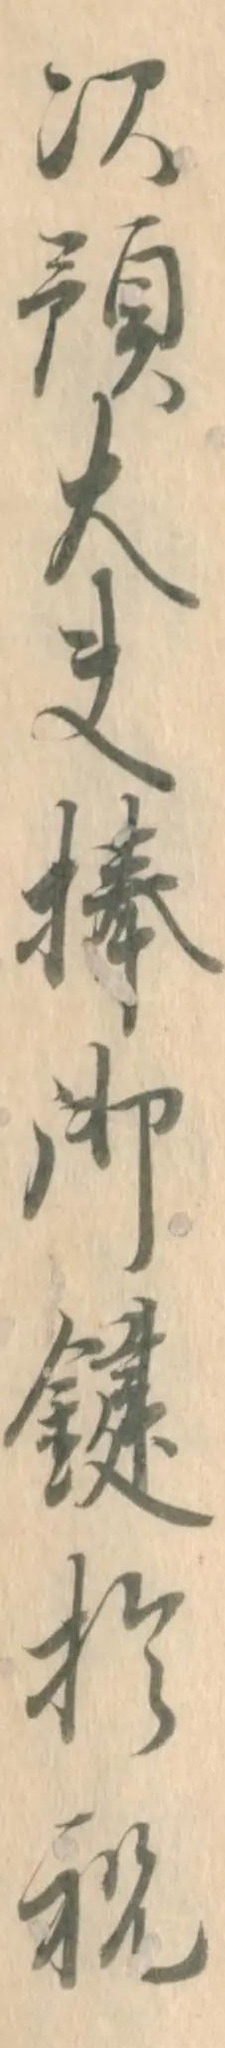次預大夫捧御鍵於祝

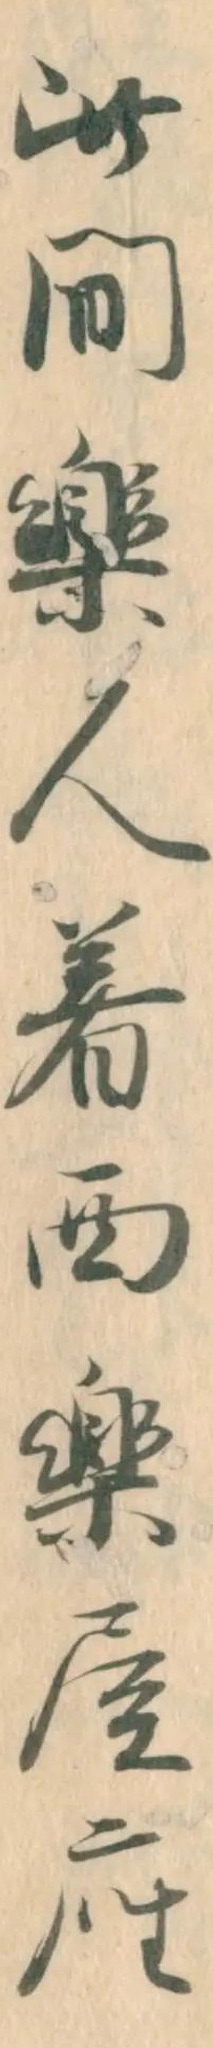此間楽人着西楽屋座
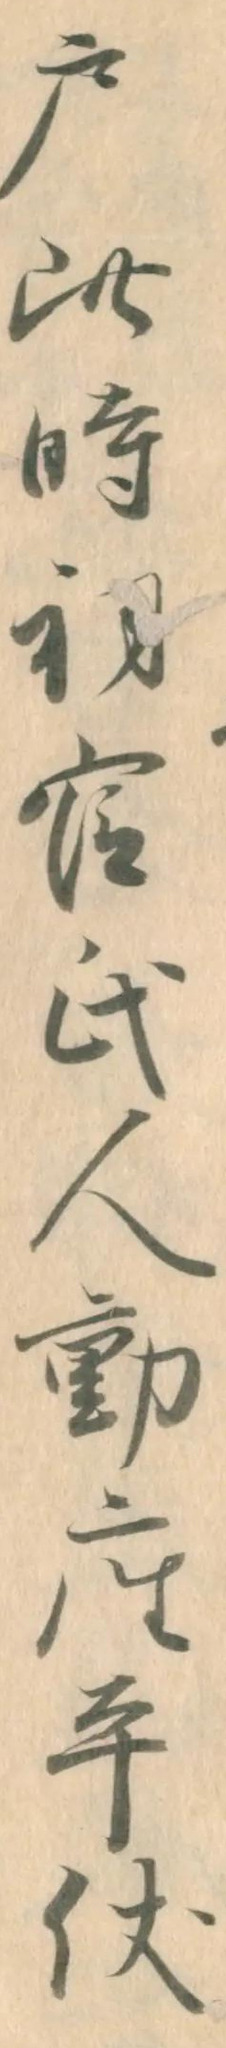戸此時祠官氏人動座平伏
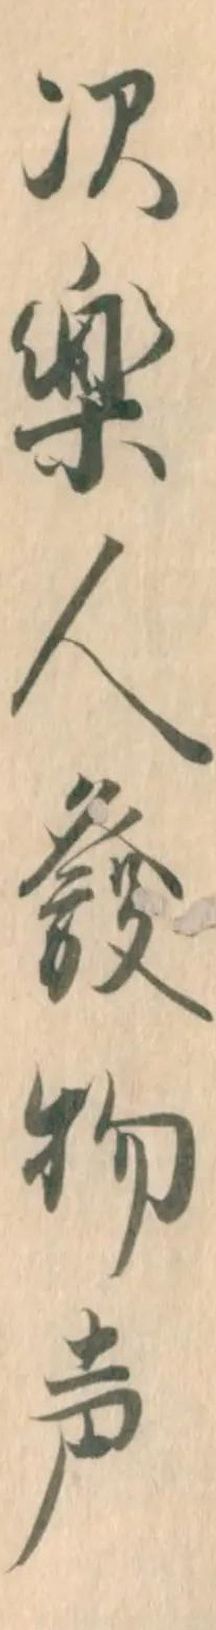次楽人発物声
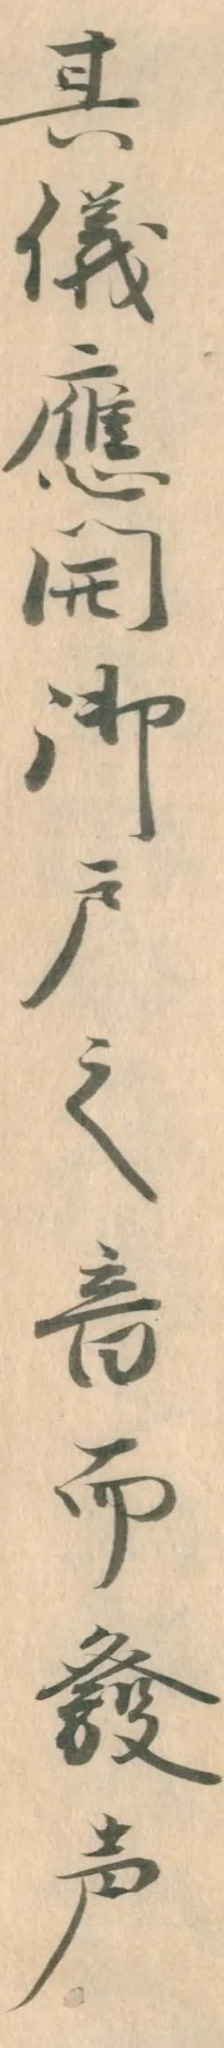其儀応開御戸之音而発声
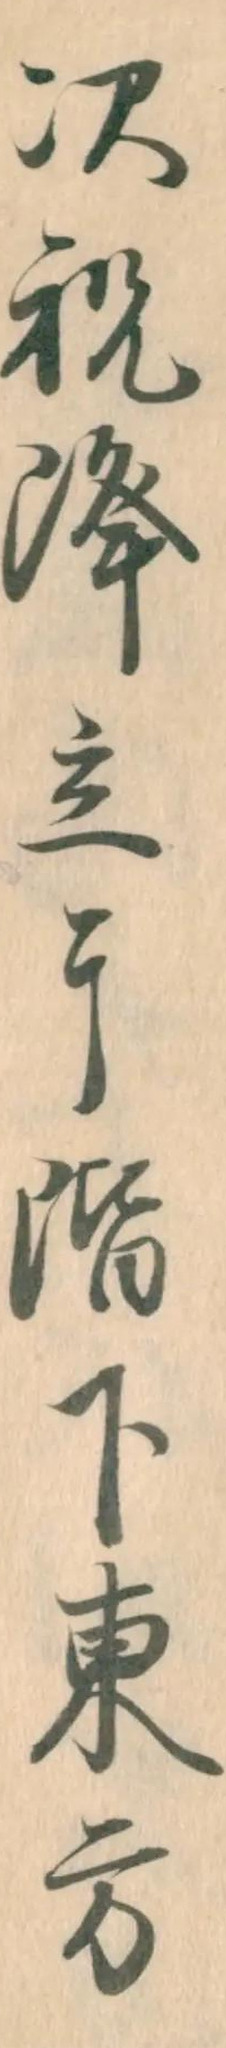次祝降立于階下東方
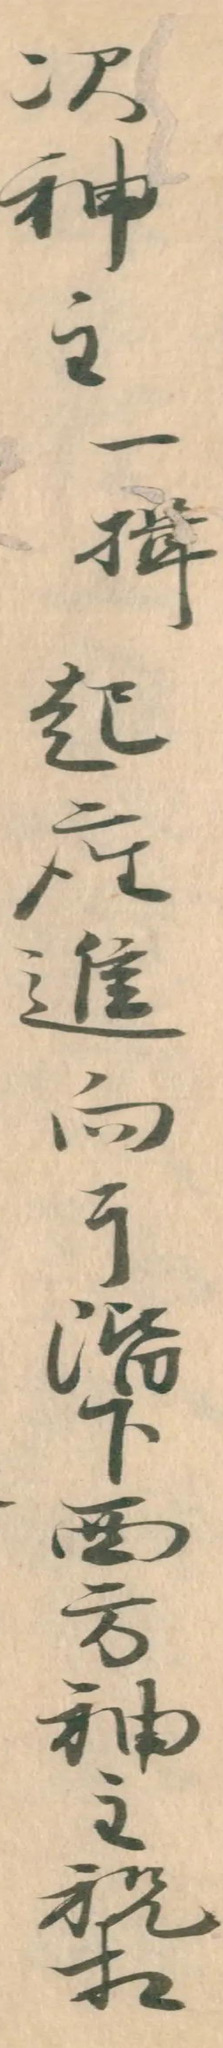次神主一揖起座進向于階下西方神主祝相
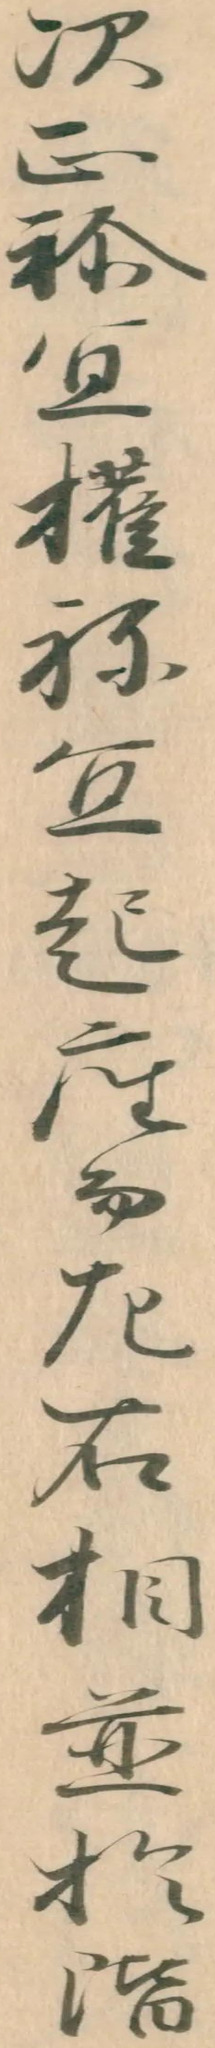次正禰宜権禰宜起座而左右相並於階
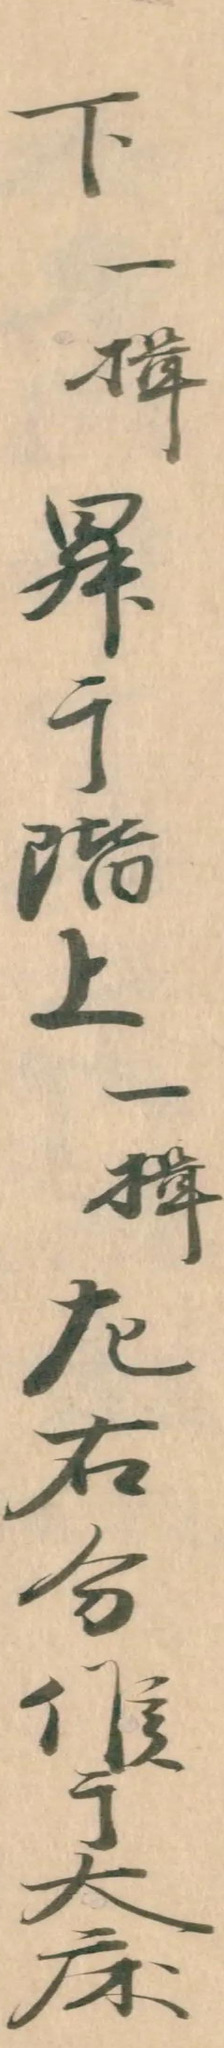下一揖昇干階上一揖左右分候干大床
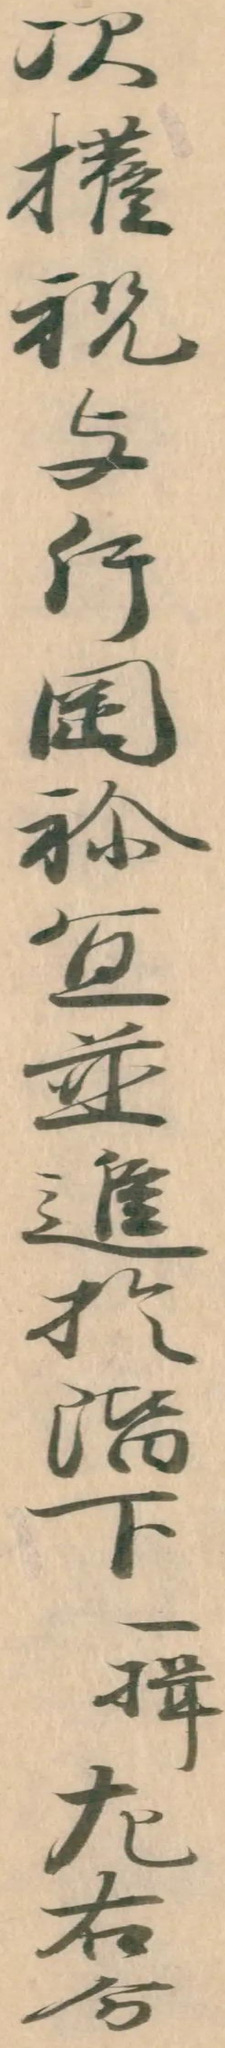次権祝と片岡禰宜並進於階下一揖左右分
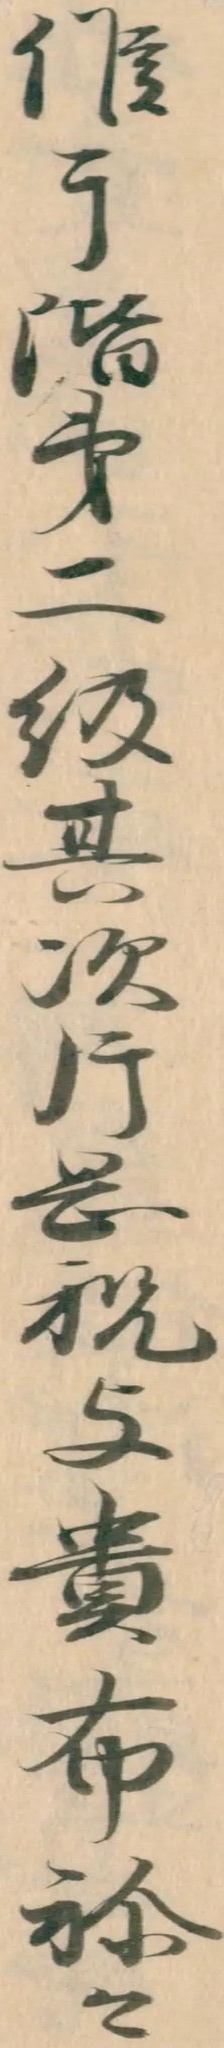候于階第二級其次片岡祝と貴布禰々
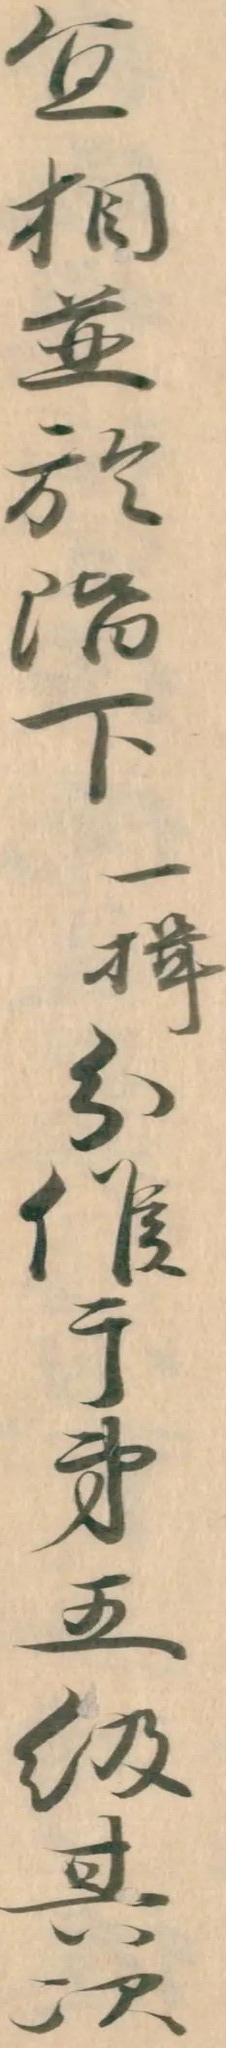宜相並於階下一揖分候于第五級其次
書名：賀茂太神宮年中神事略次第
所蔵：国立国会図書館 National Diet Library, JAPAN
